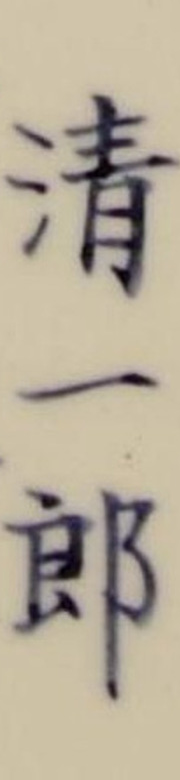清一郎
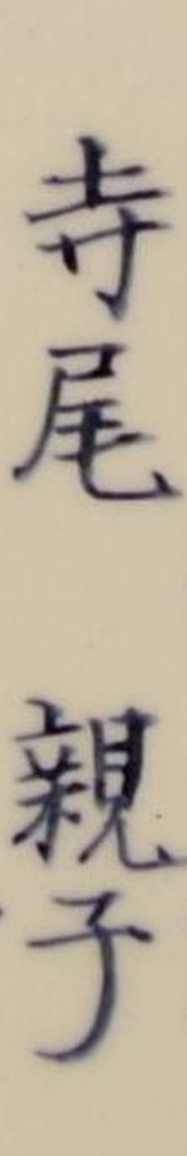寺尾親子
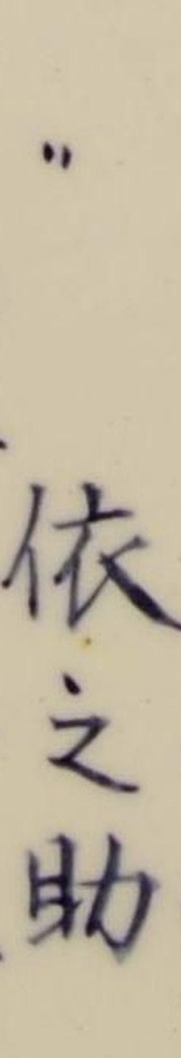依之助
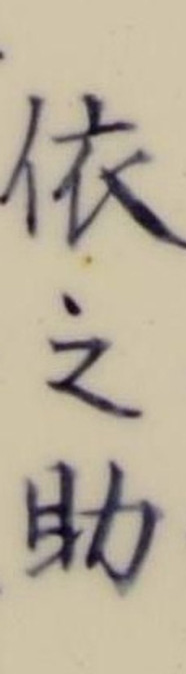依之助
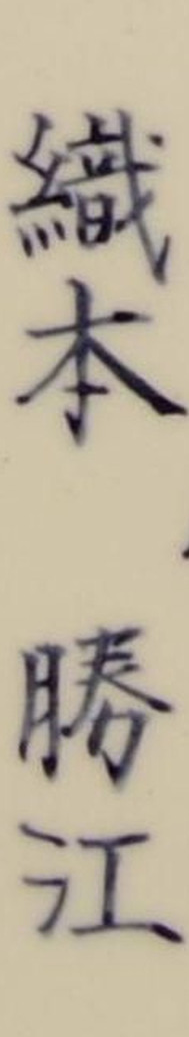織本勝江
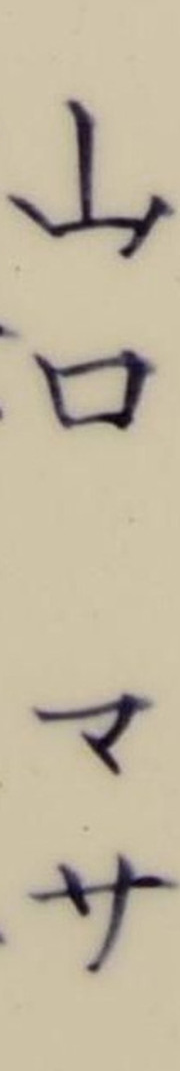山口マサ
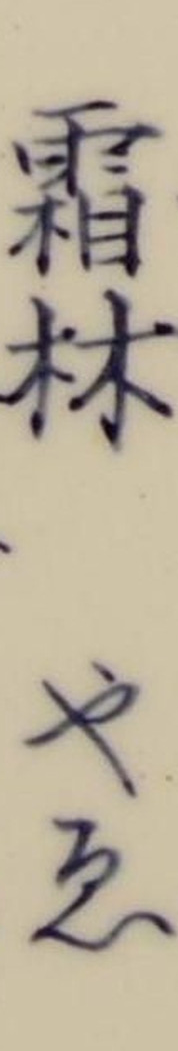霜林やえ
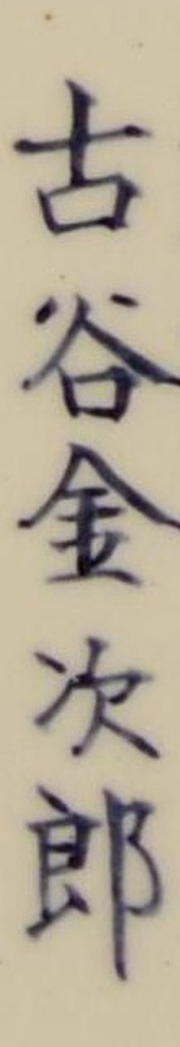古谷金次郎
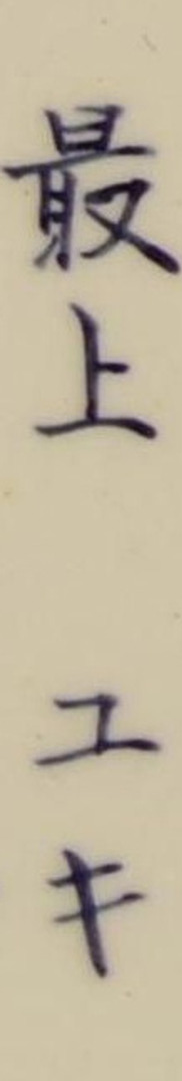最上ユキ
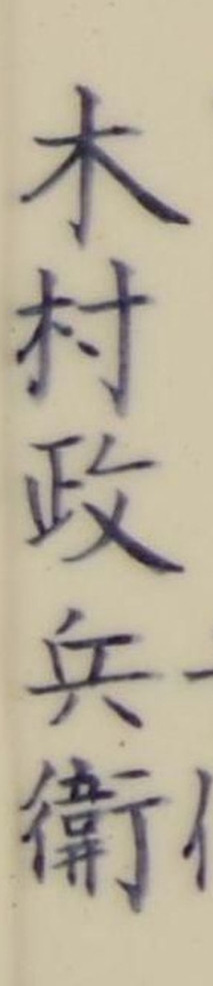木村政兵衛

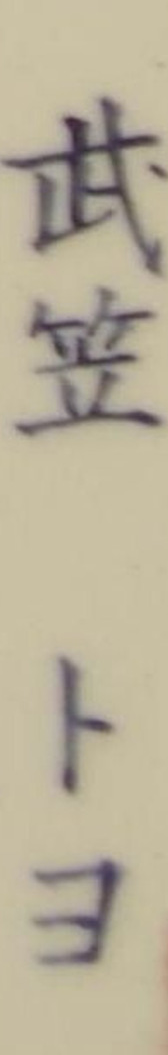武笠トヨ
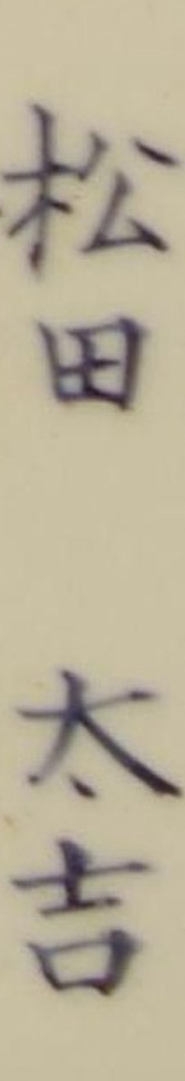松田太吉
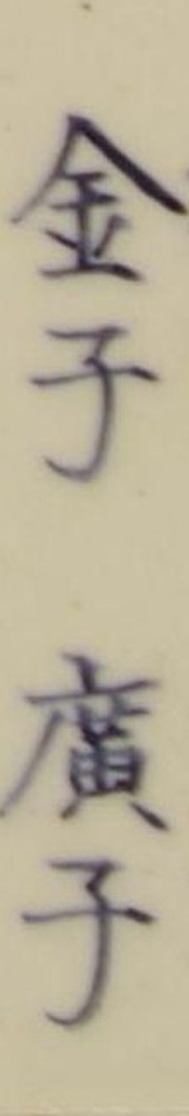金子廣子
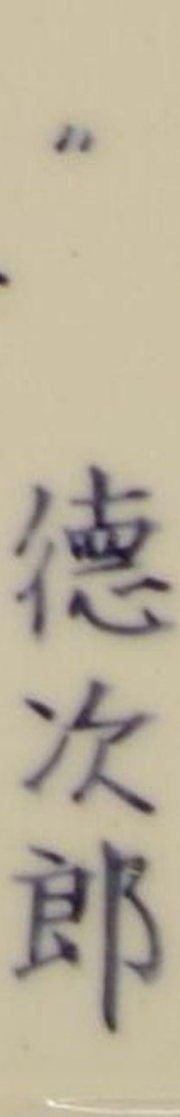徳次郎
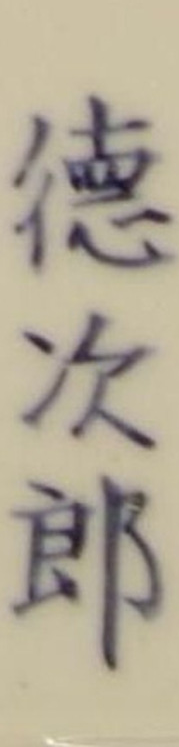徳次郎
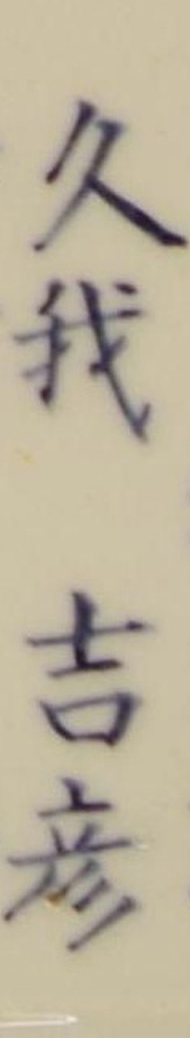久我吉彦
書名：E~L
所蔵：高野山金剛峯寺
